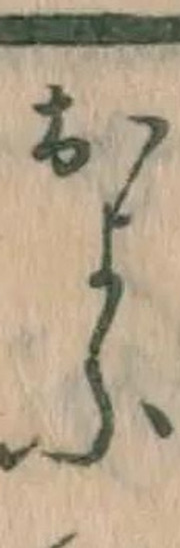およふ

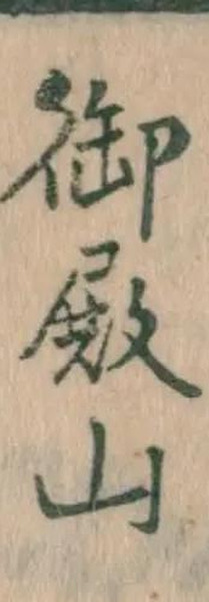御殿山
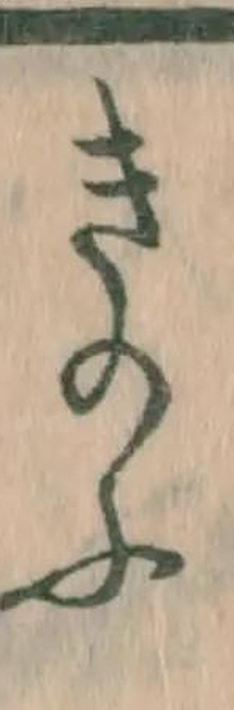きのふ
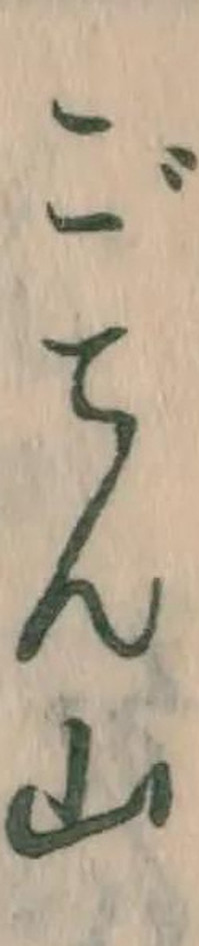ごてん山
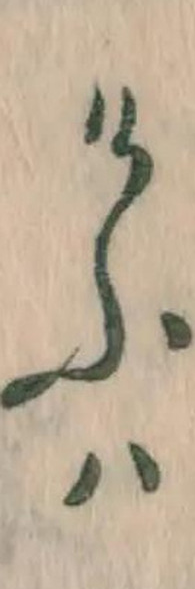けふは
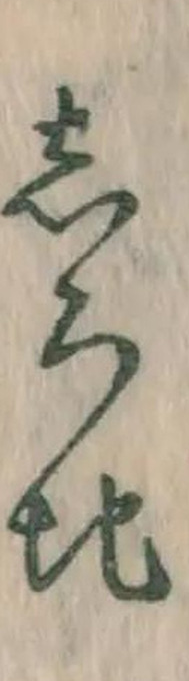しろ地
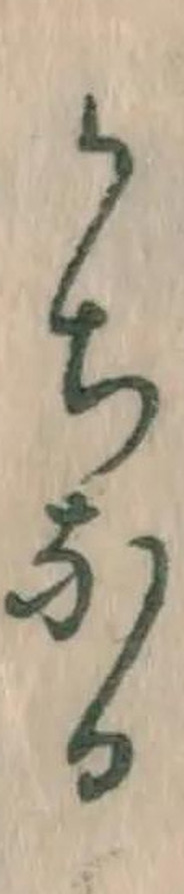かちなる

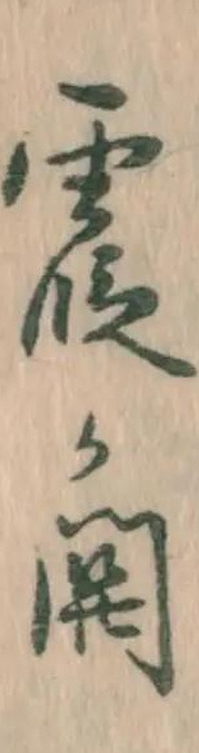霞か関
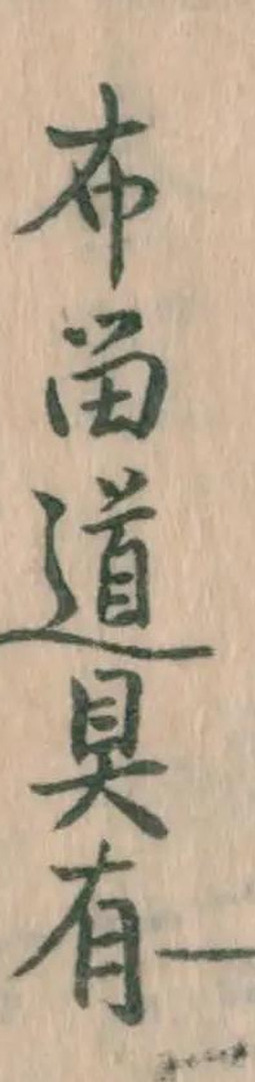布留道具有
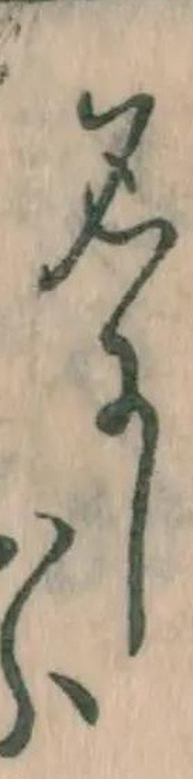名にし

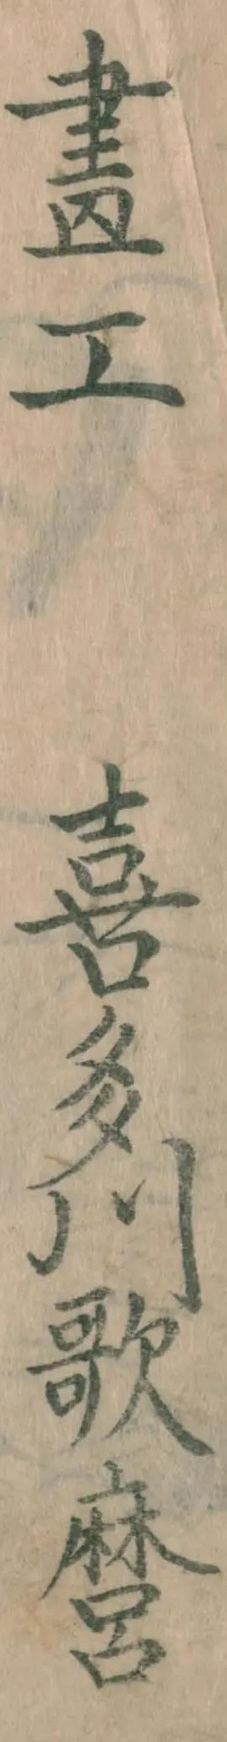画工喜多川歌麿
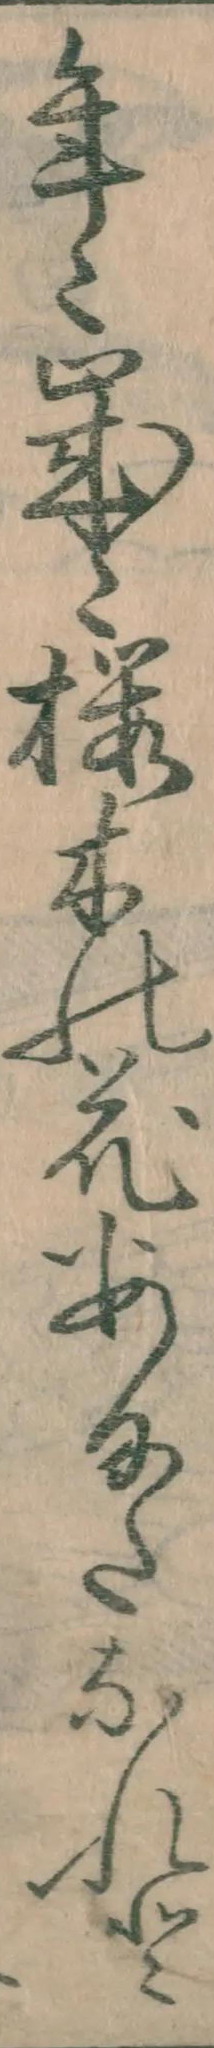年々歳々桜木の花あまたなれと
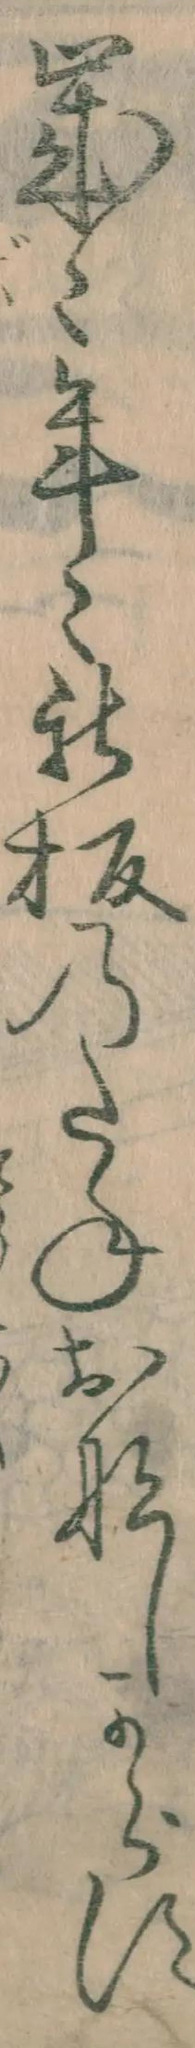歳々年々新板のたねおなしからす
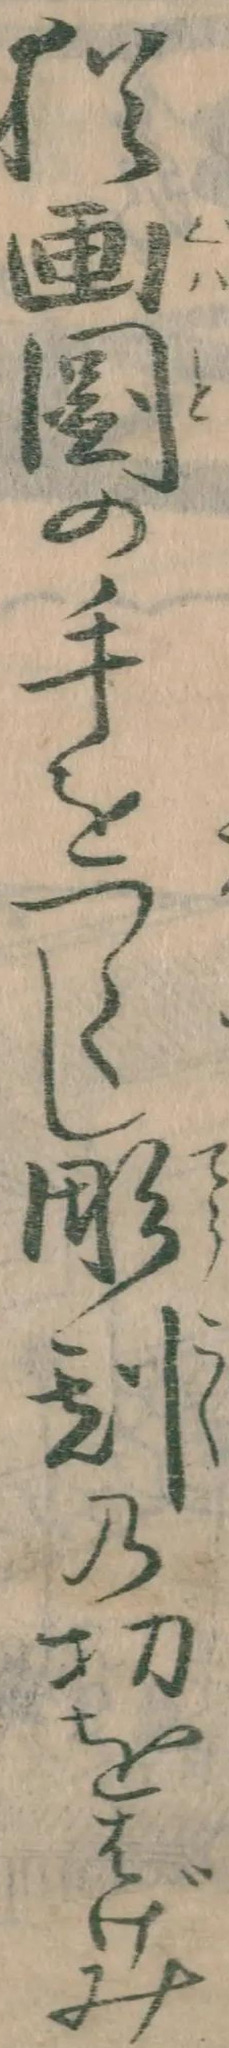猶画図の手をつくし彫刻の功をはげみ
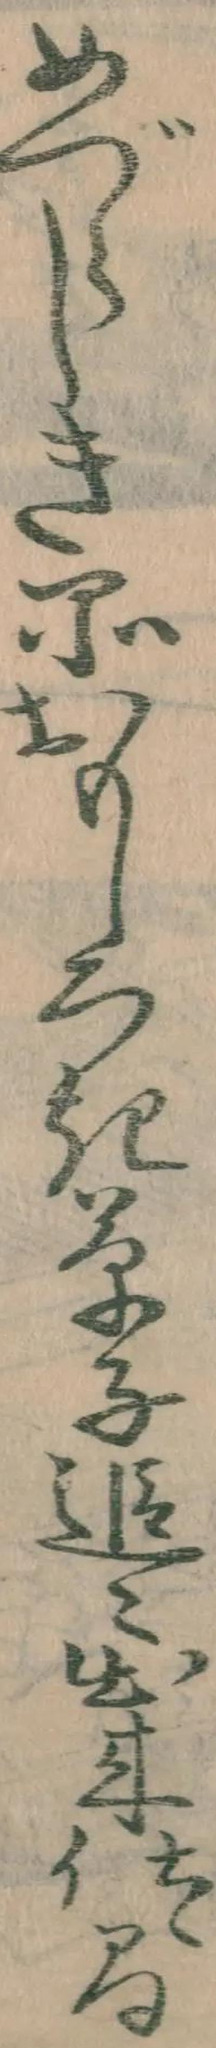めづらしき品おもしろき草子追々出来仕候間
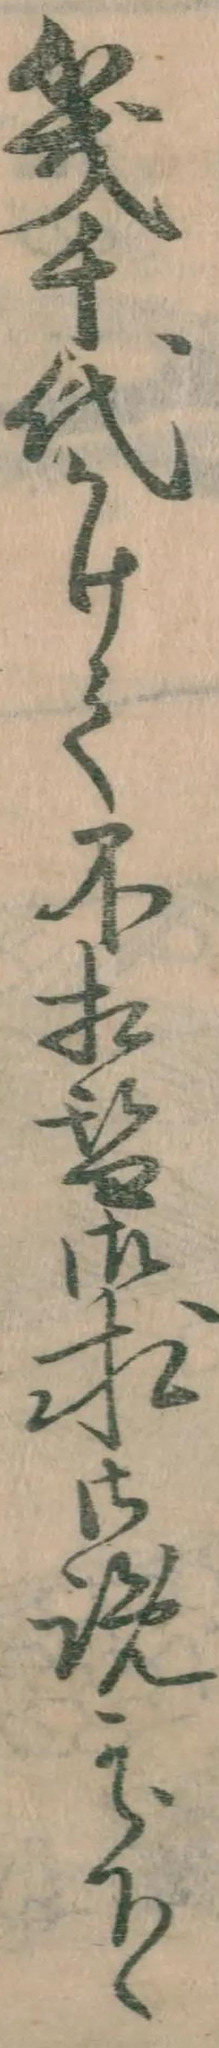幾千代かけて不相替御求御覧可被下候
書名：駿河舞 3巻
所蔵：国立国会図書館 National Diet Library, JAPAN
